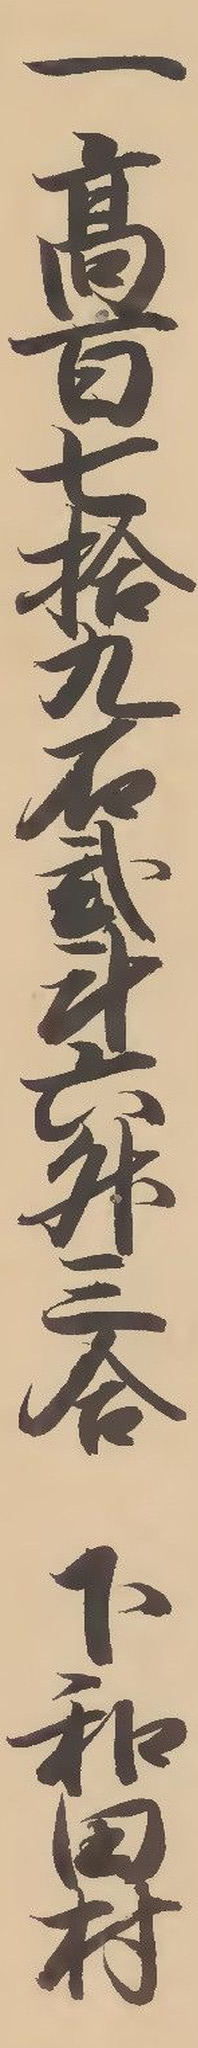一高百七拾九石弐斗六升三合下和田村

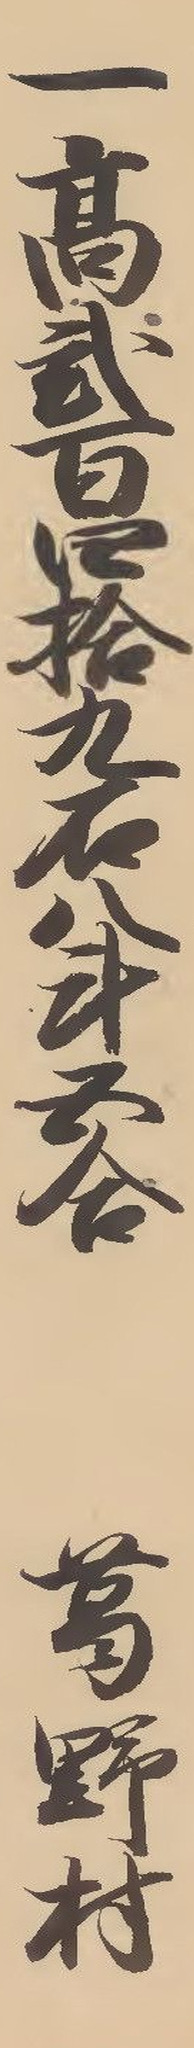一高弐百四拾九石八斗五合葛野村
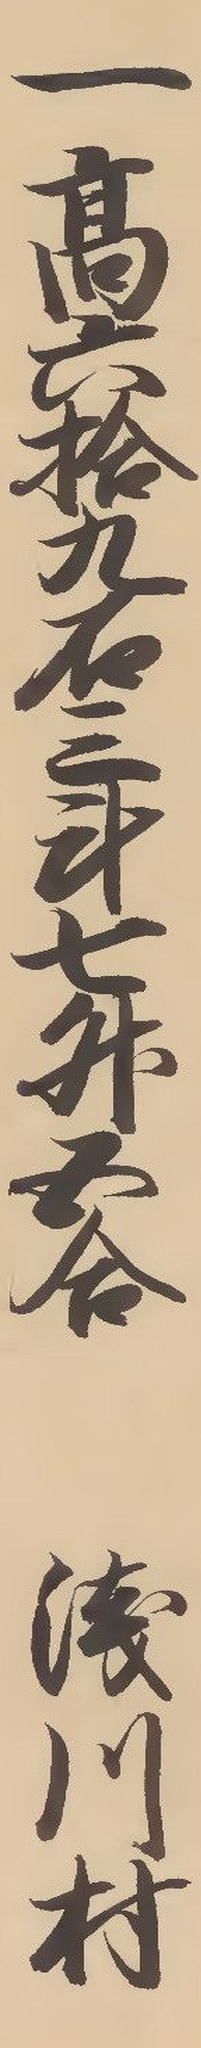一高六拾九石三斗七升五合浅川村
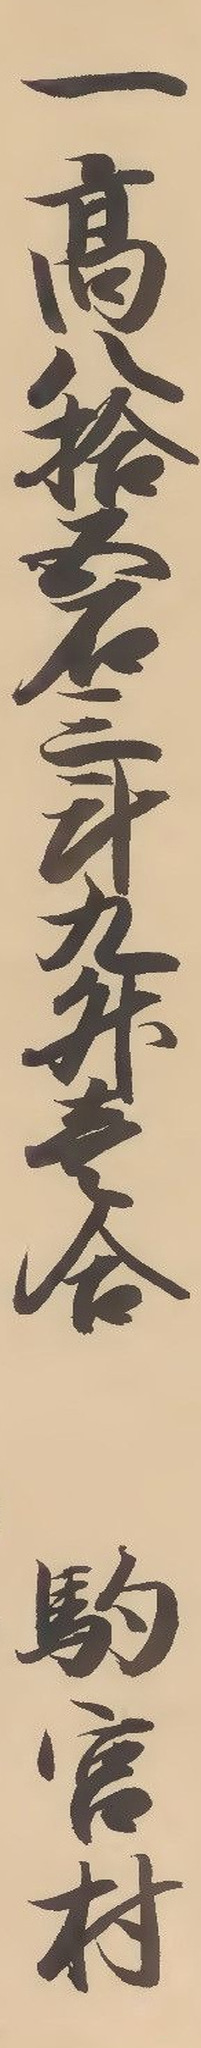一高八拾五石三斗九升壱合駒宮村
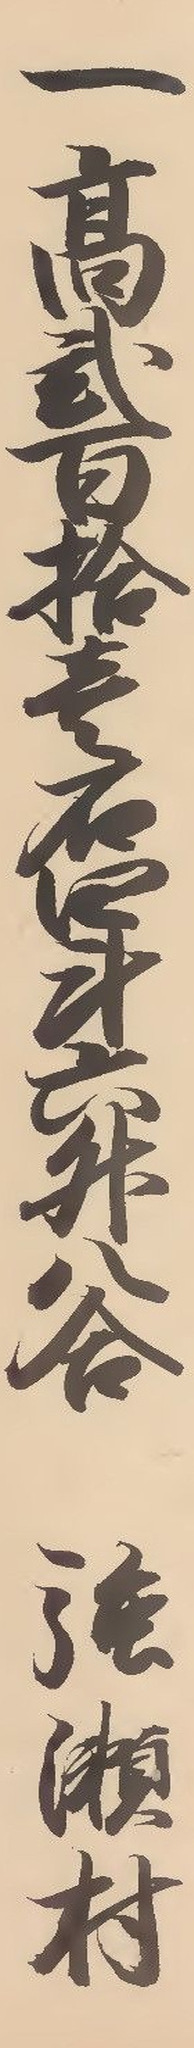一高弐百拾壱石四斗六升八合強瀬村
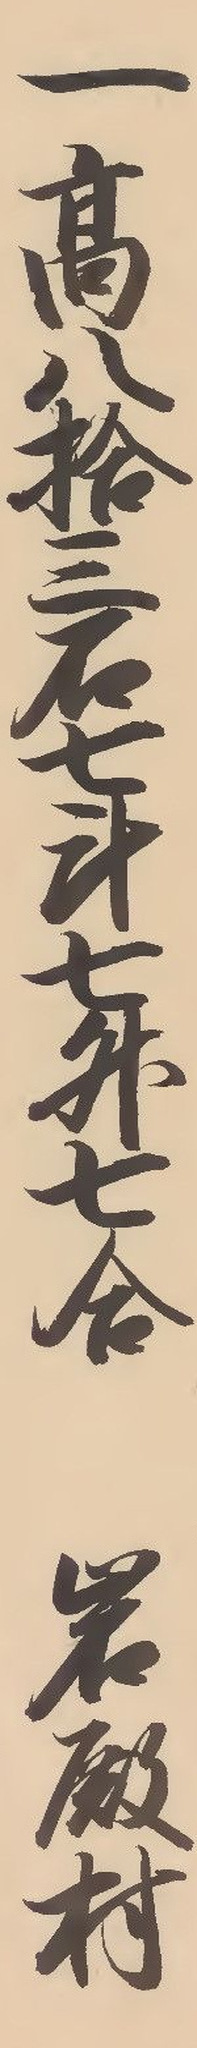一高八拾三石七斗七升七合岩殿村
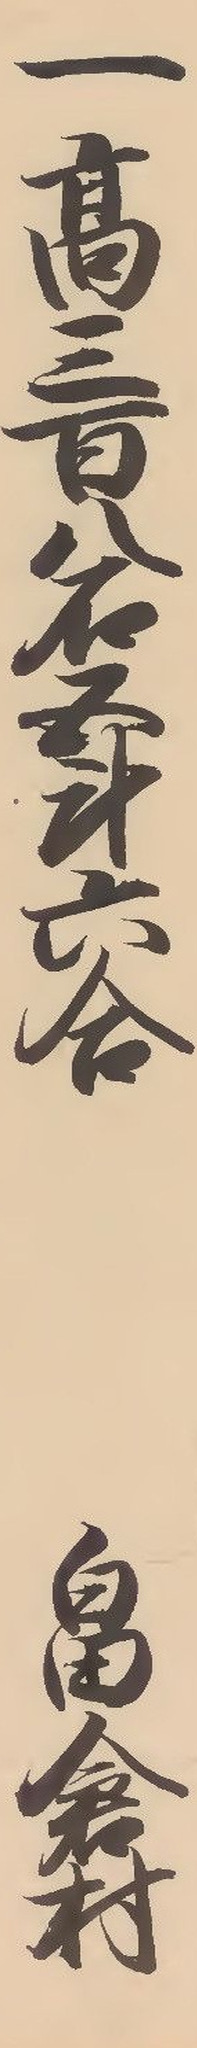一高三百八石五斗六合畠倉村
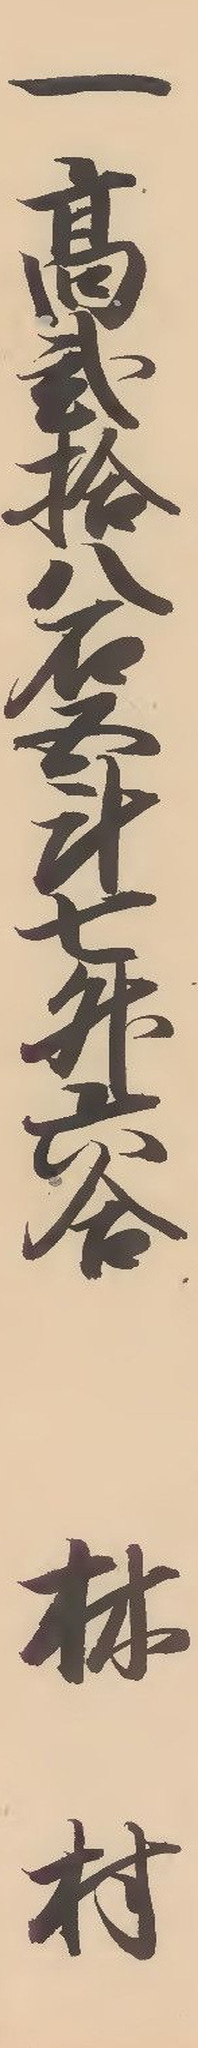一高弐拾八石五斗七升六合林村

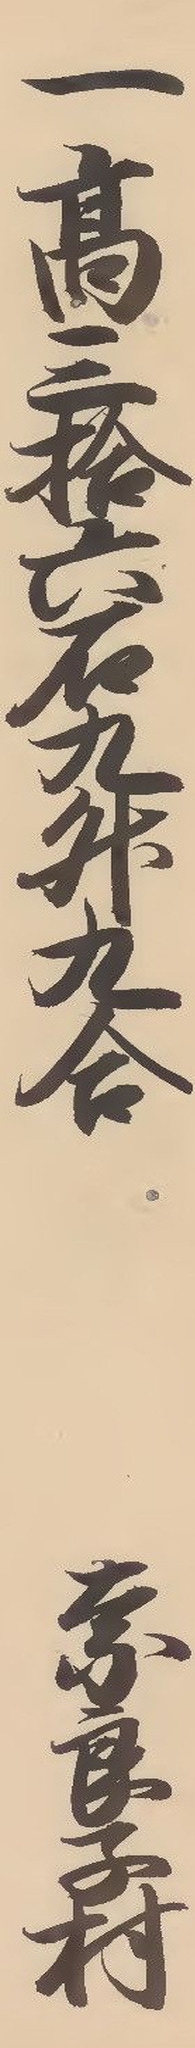一高三拾六石九升九合奈良子村
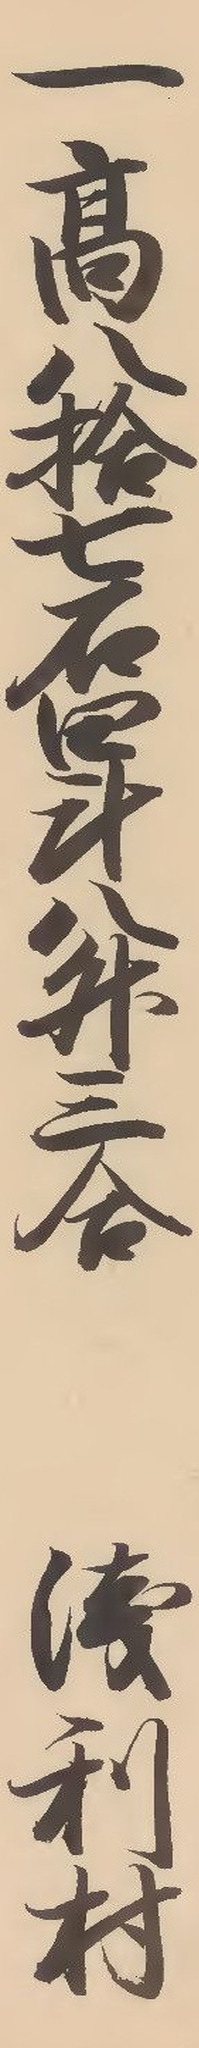一高八拾七石四斗八升三合浅利村
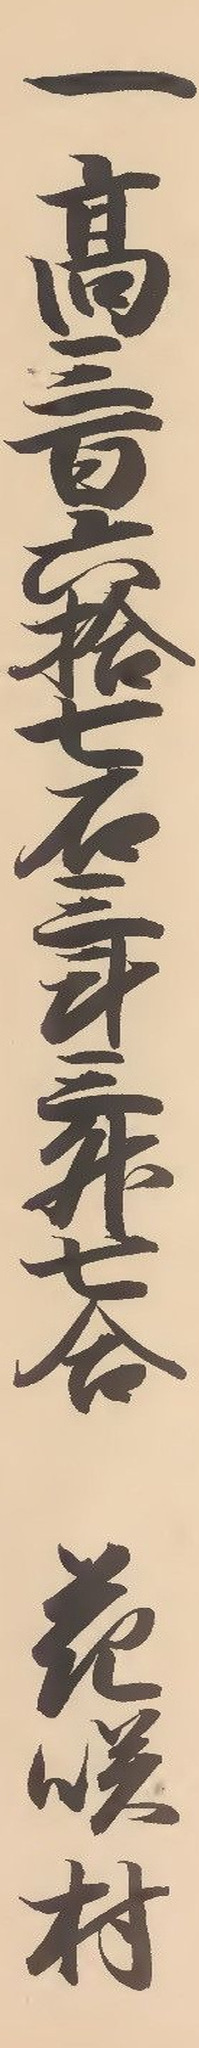一高三百六拾七石三斗三升七合花咲村
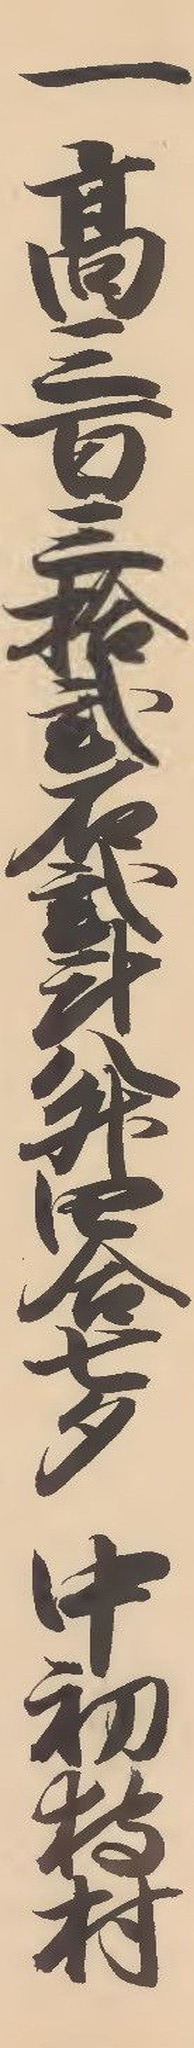一高三百三拾弐石弐斗八升四合七勺中初狩村
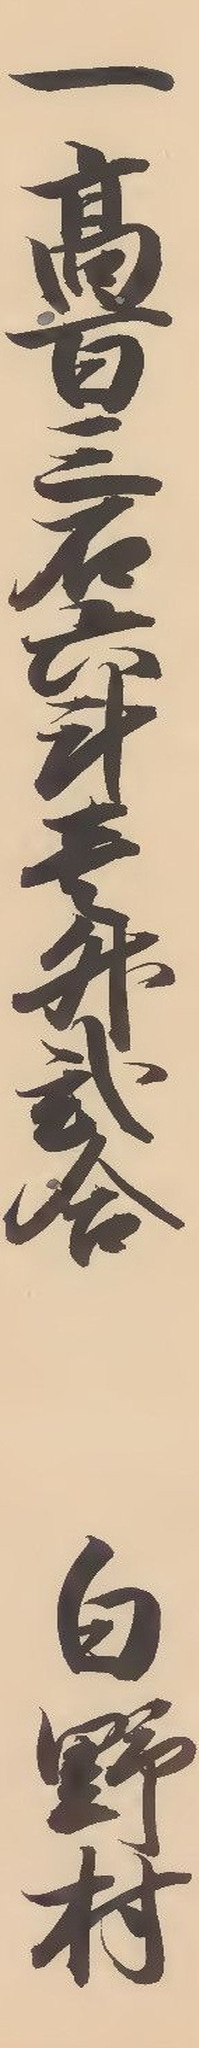一高百三石六斗壱升弐合白野村

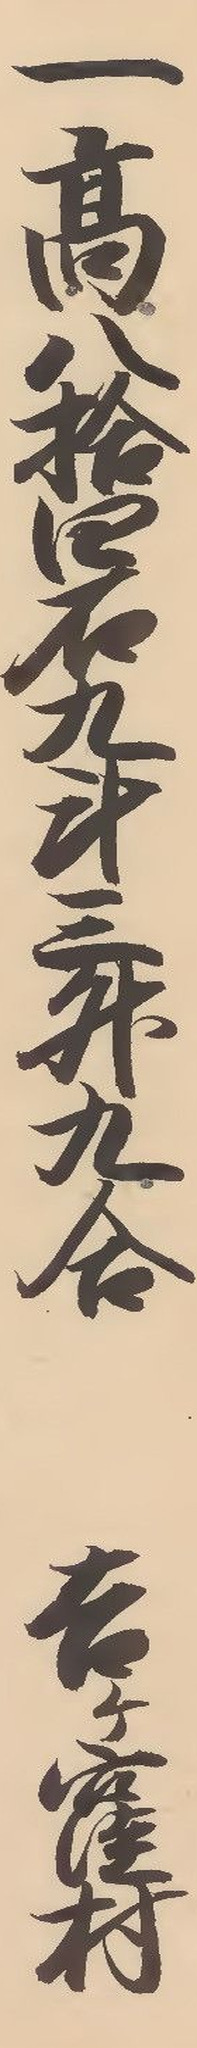一高八拾四石九斗三升九合吉ヶ窪村
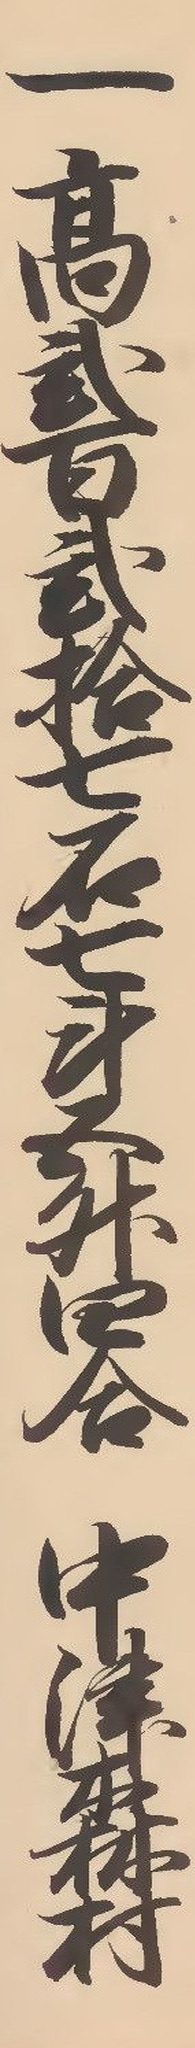一高弐百弐拾七石七斗五升四合中津森村
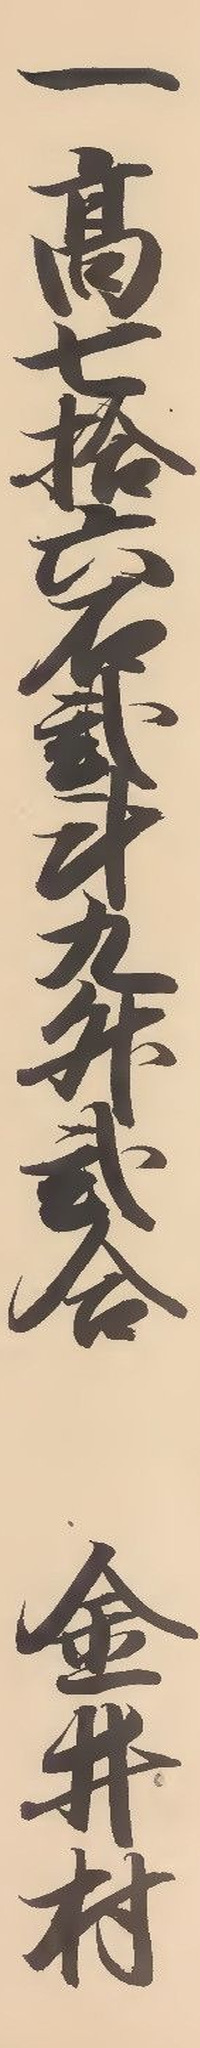一高七拾六石弐斗九升弐合金井村
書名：甲斐国郷帳
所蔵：国立公文書館 National Archives of Japan
